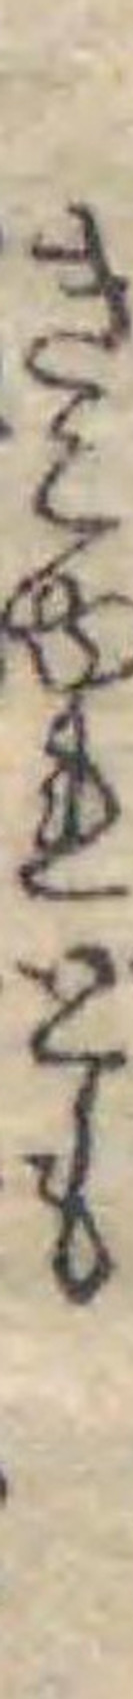きこゆれども
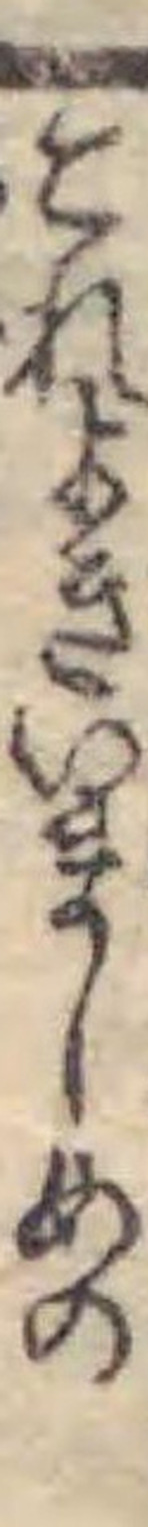これよきいましめの
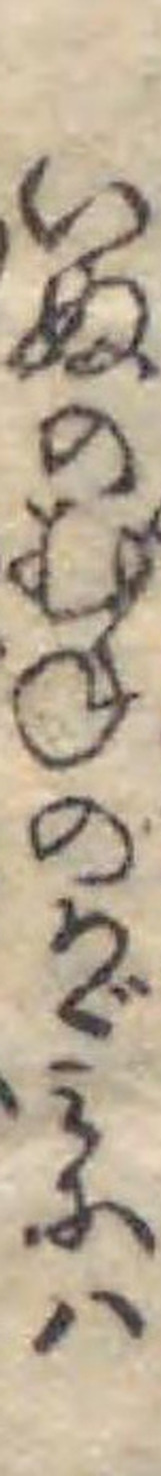いぬのむねのかゞみには
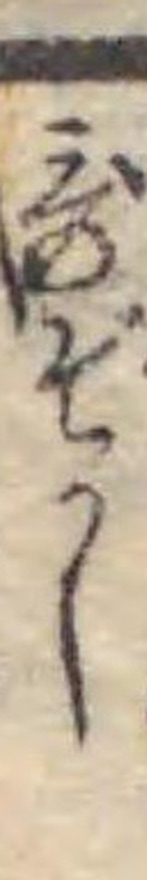哥ぞかし
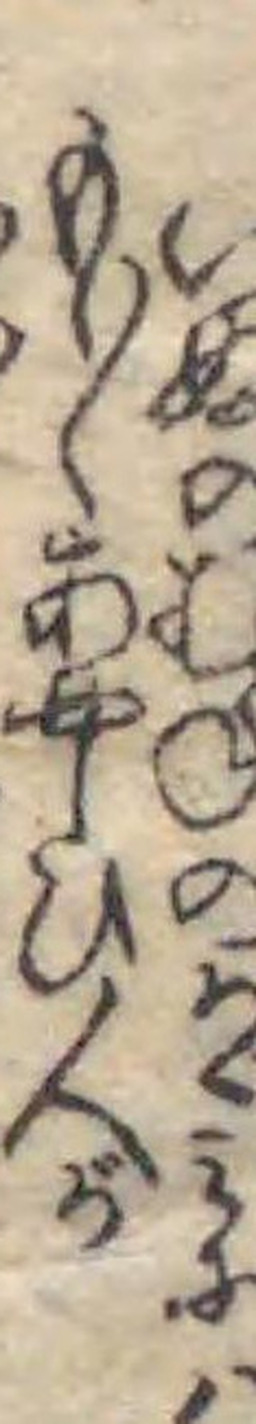もし〳〵あやしひ人が
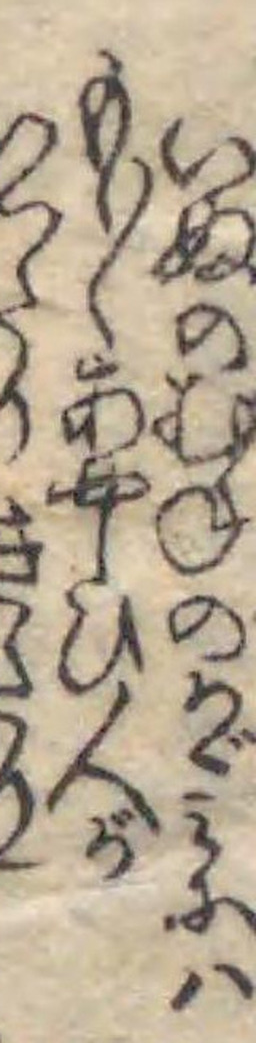もし〳〵あやしひ人が
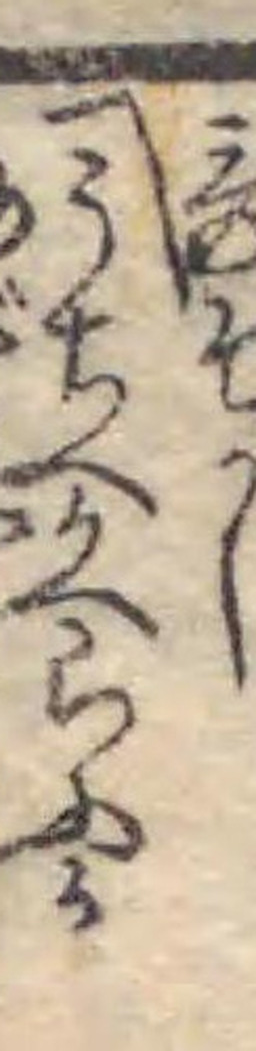〽うちへかへらふか
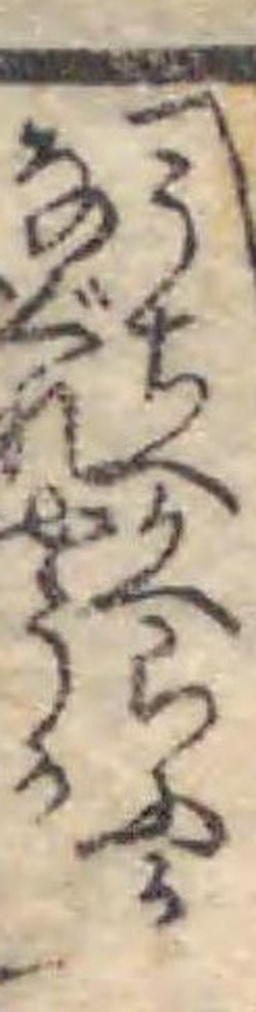なぐれやうか
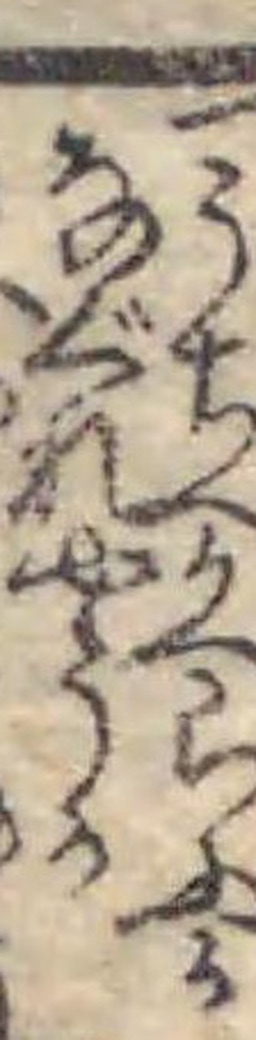なぐれやうか
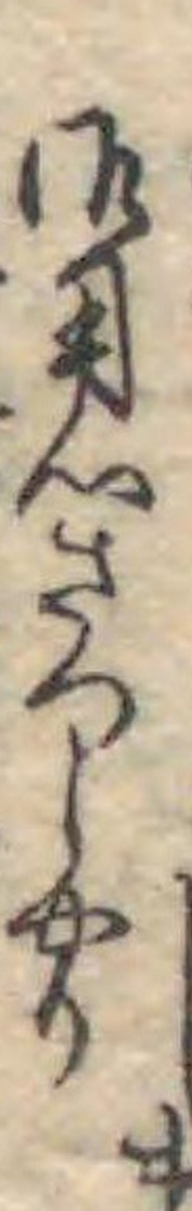御用心さつしやり
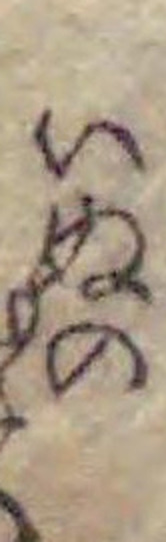いぬの
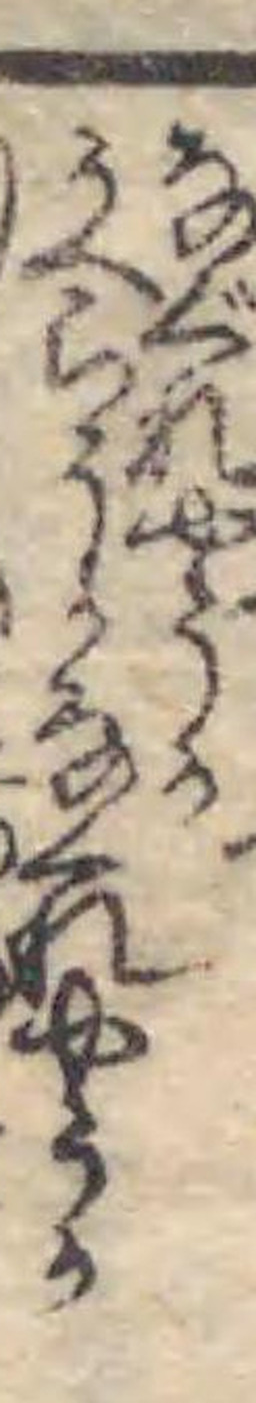かへらうかなくれやうか
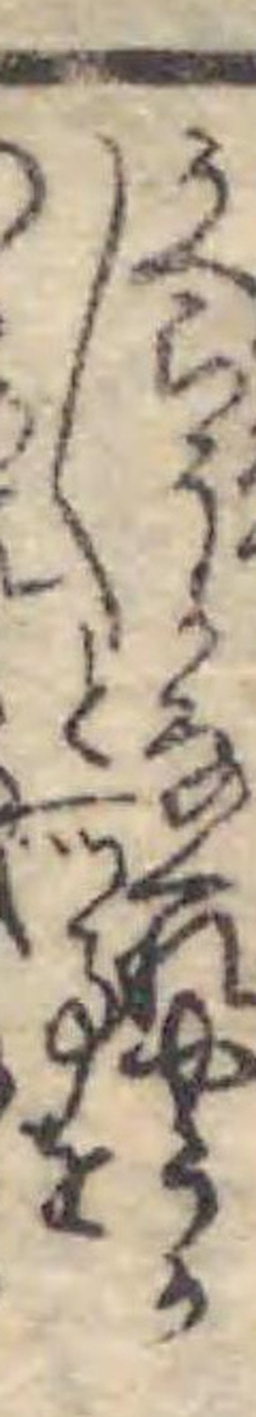〳〵と一つ事を
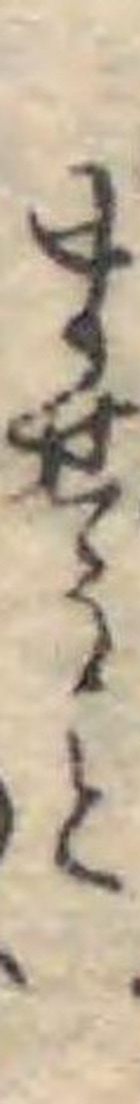ませうと
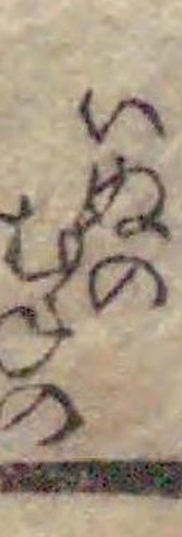いぬの
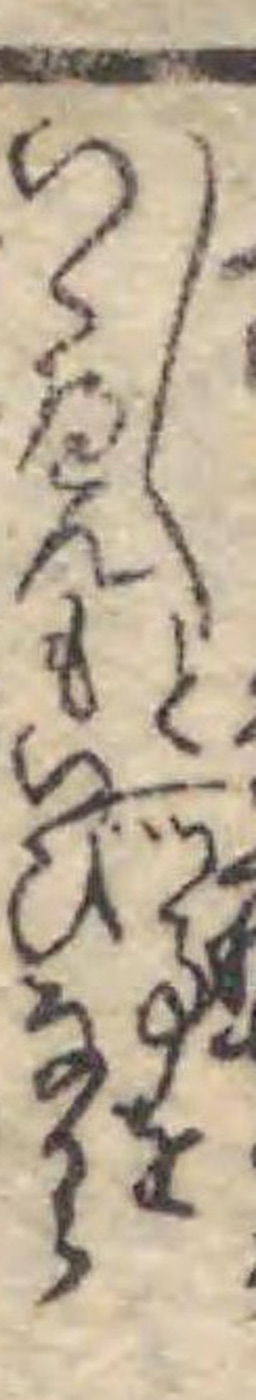いくへんもいひながら
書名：人心鏡写絵 : 3巻
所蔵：国立国会図書館 National Diet Library, JAPAN
